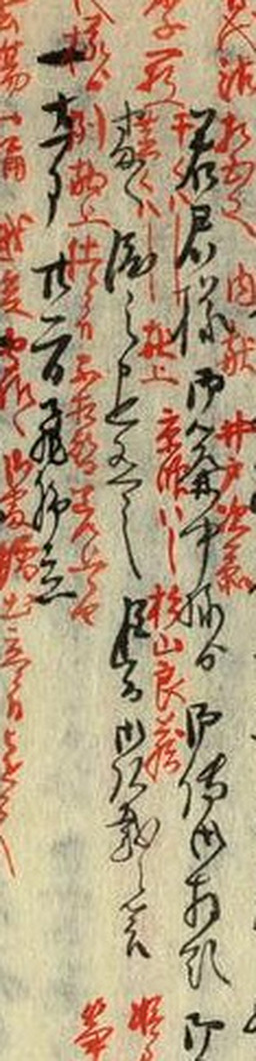番へ渡之申上有之追而御頂戴之筈
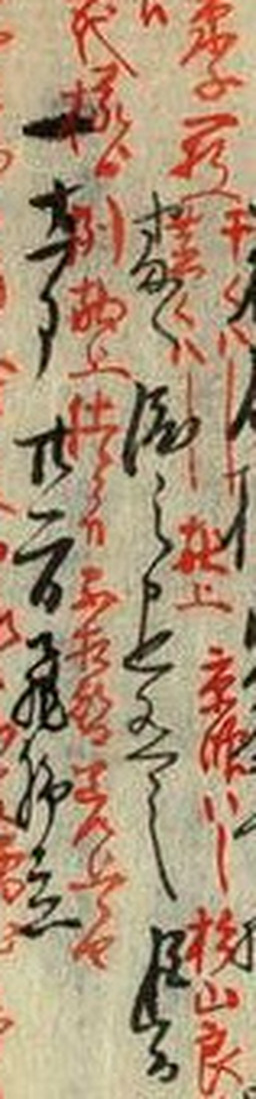一十一月廿二日飛脚立
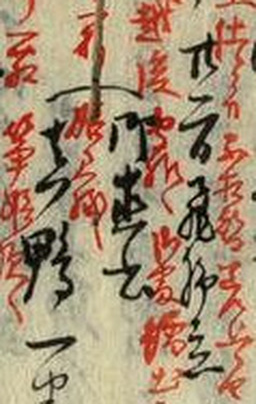御直書
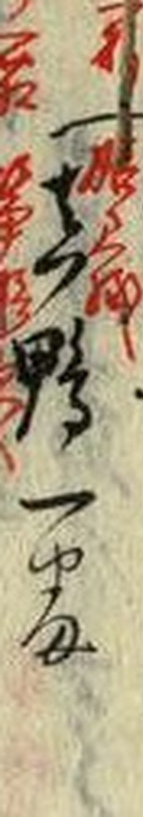真鴨一番
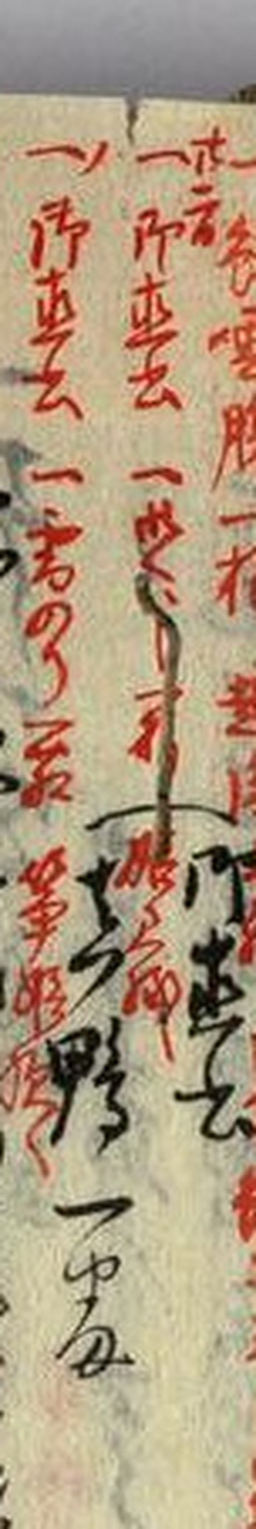同一御直書一雪のり一箱箏姫様へ
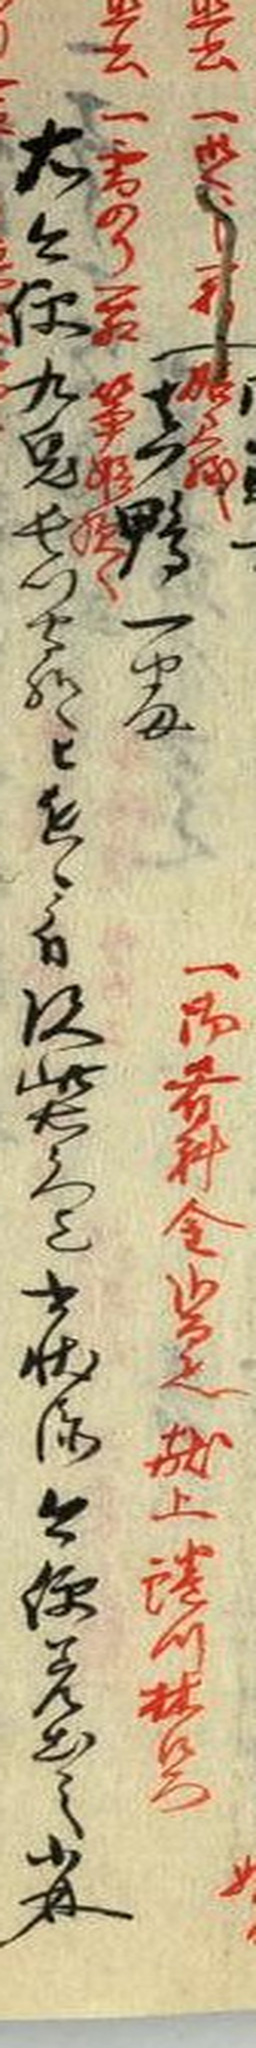右今便九鬼長門守様へ被進候ニ付沢右衛門迄書状添今便差出之小林
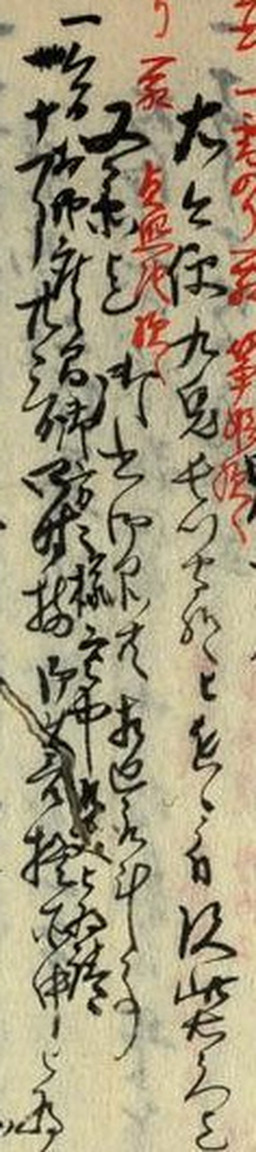又兵衛迄御書御品共相廻取計候事
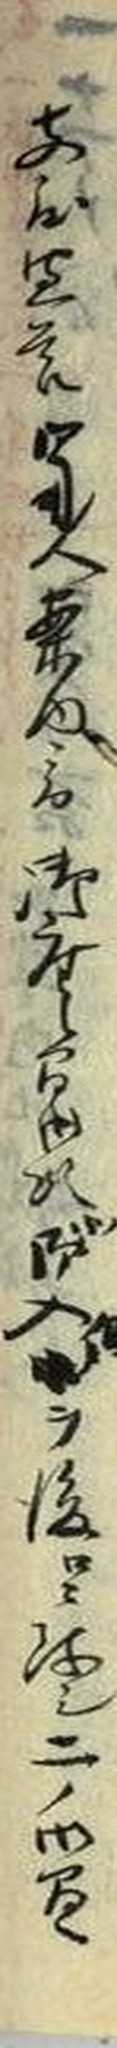支度宜節御用人案内ニ而御座之間御次北御入側ヲ後口ニ致シ二ノ御間へ
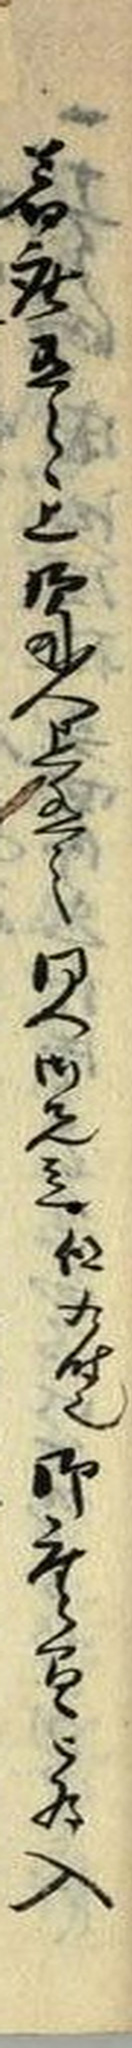着座有之候上御用人申上有之同人御先立但九時也御座之間へ被為入
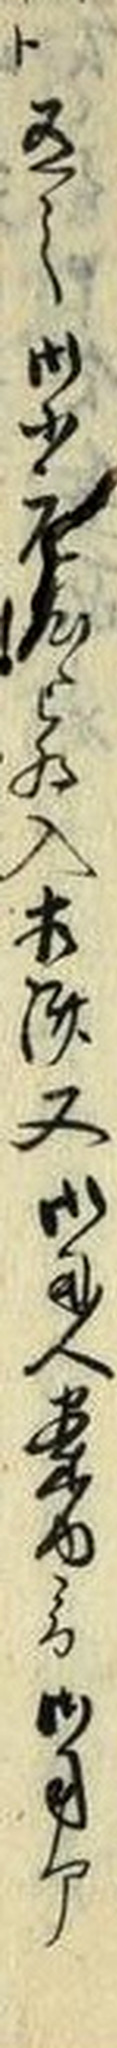ユルリト有之御小座敷へ被為入相済又御用人案内ニ而御用部
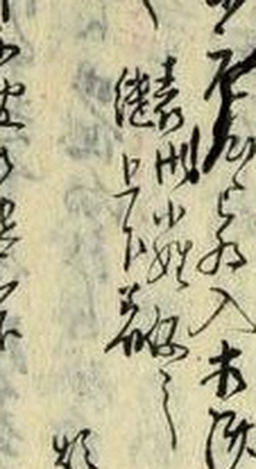継上下着
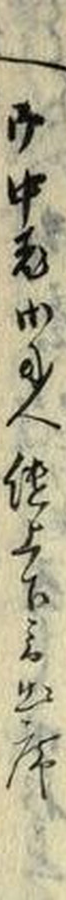御中老御用人継上下ニ而出席運正寺
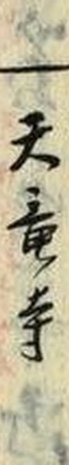天竜寺
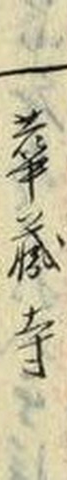華蔵寺
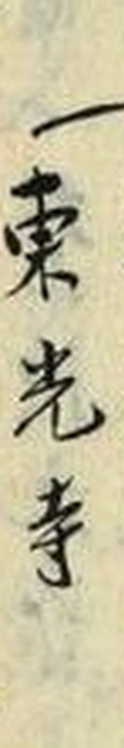東光寺
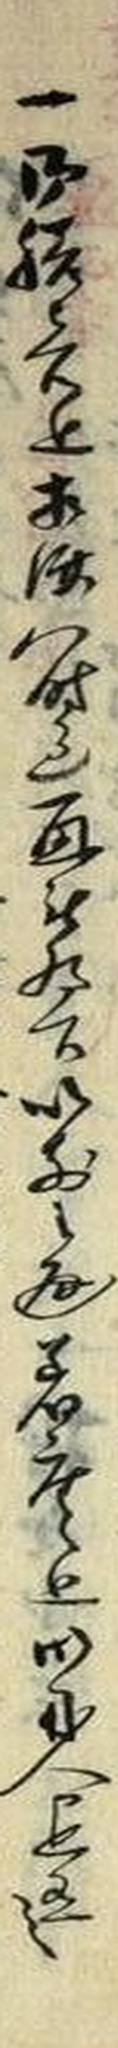一御膳被召上相済八時過再被為召以前之通着座之上御用人申上有之
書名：少傅日録抄（斉承付側向頭取日記、在国）
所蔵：福井県文書館 Fukui Prefectural Archives
